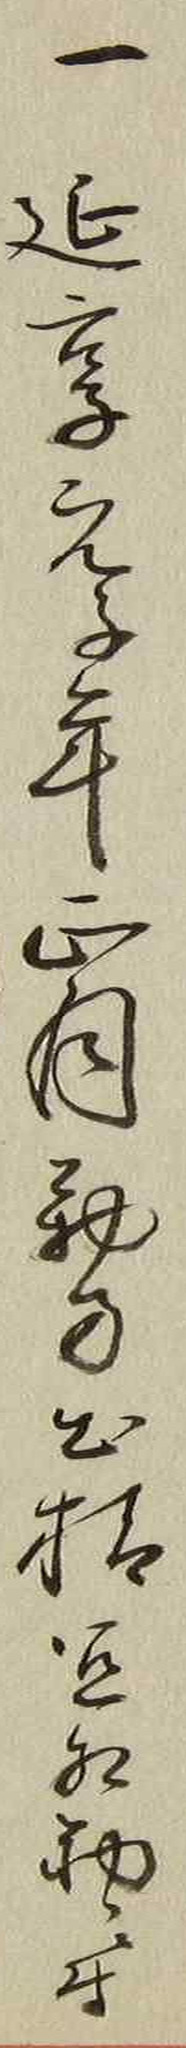一延享元子年正月勤方出精宜相勤候に付
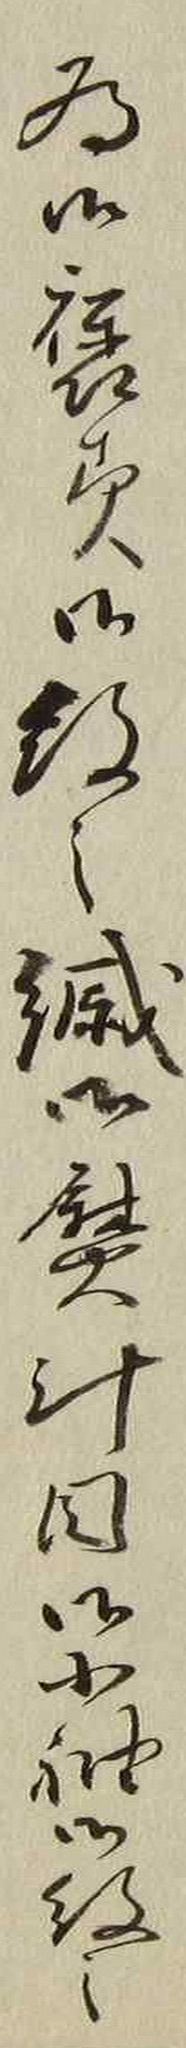為御褒美御紋之縬御熨斗目御小袖御紋之
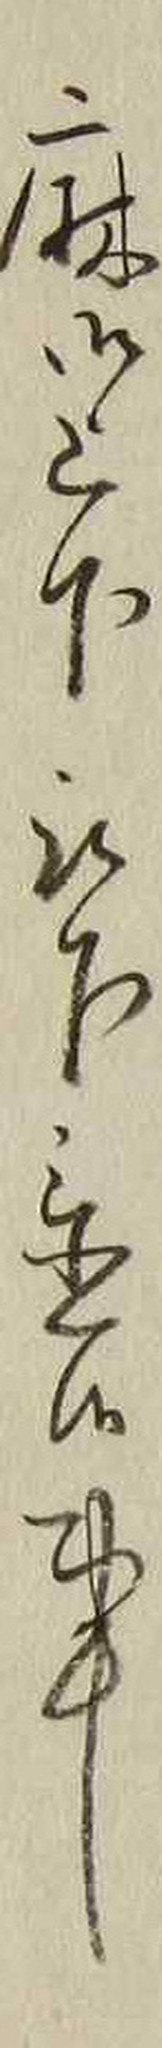麻御上下被下置候事
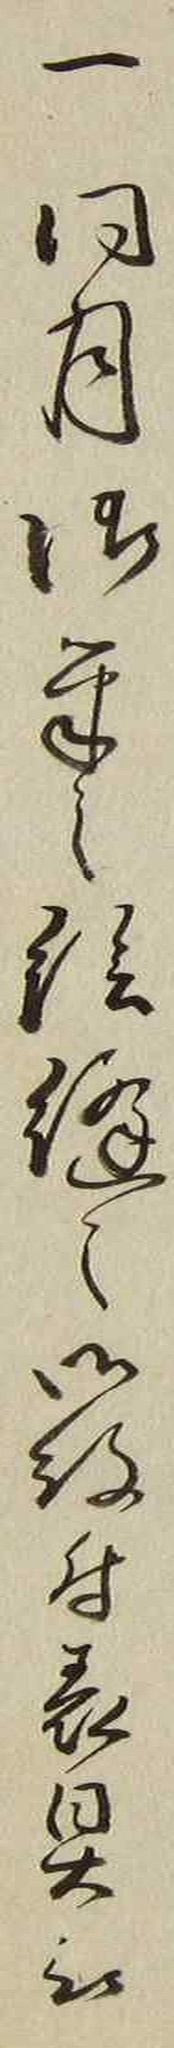一同月御筆之絵縫之御紋付表具被
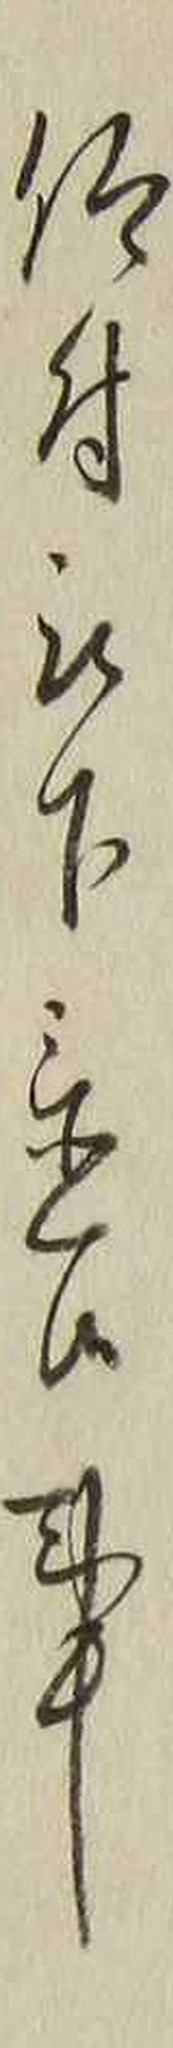仰付被下置候事

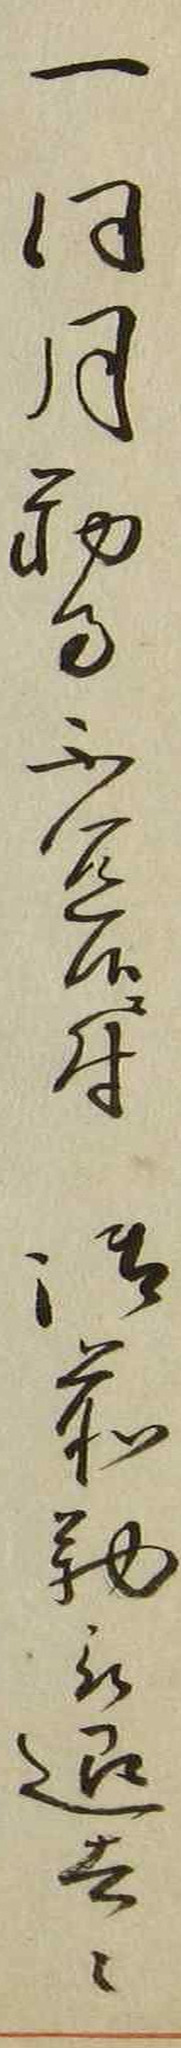一同月勤方不宜候に付御前勤被退去之
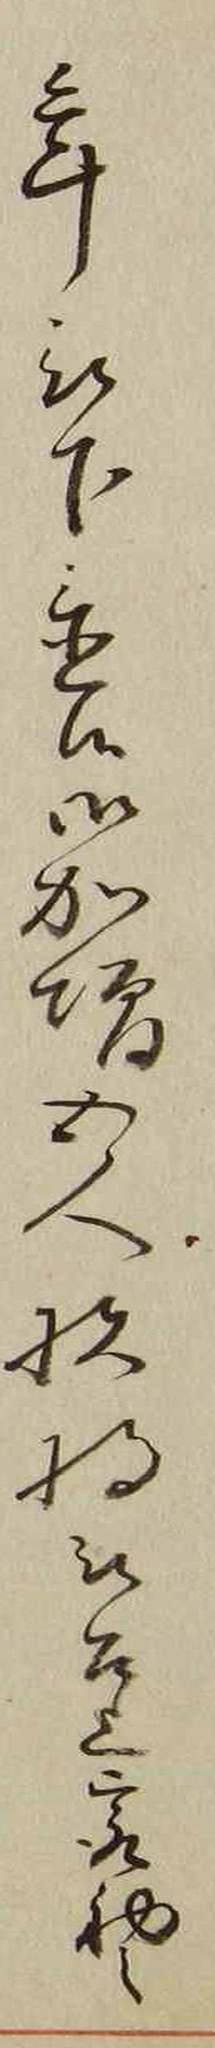年被下置候御加増五人扶持被召上最初之
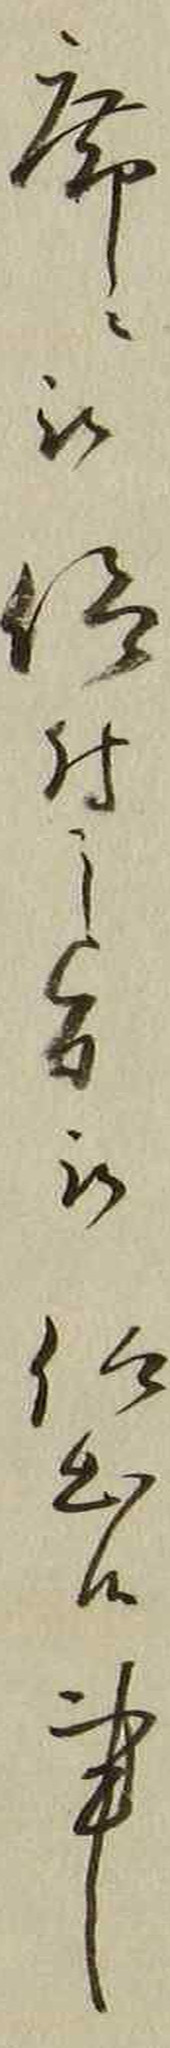席に被仰付之旨被仰出候事
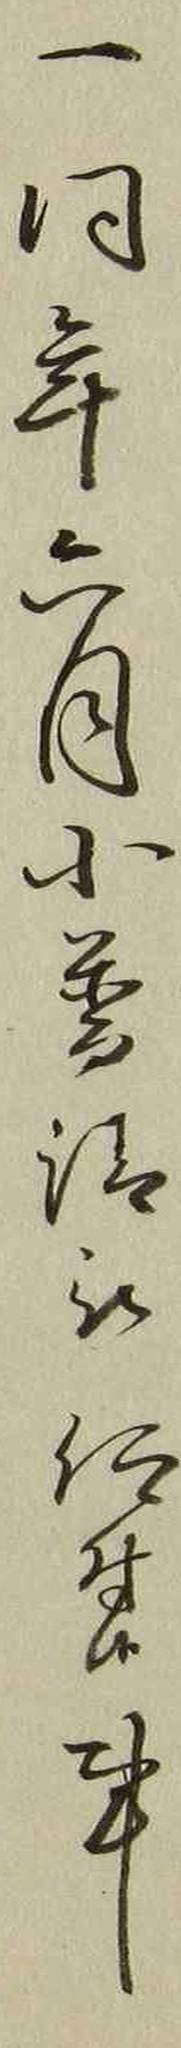一同年六月小普請被仰付候事
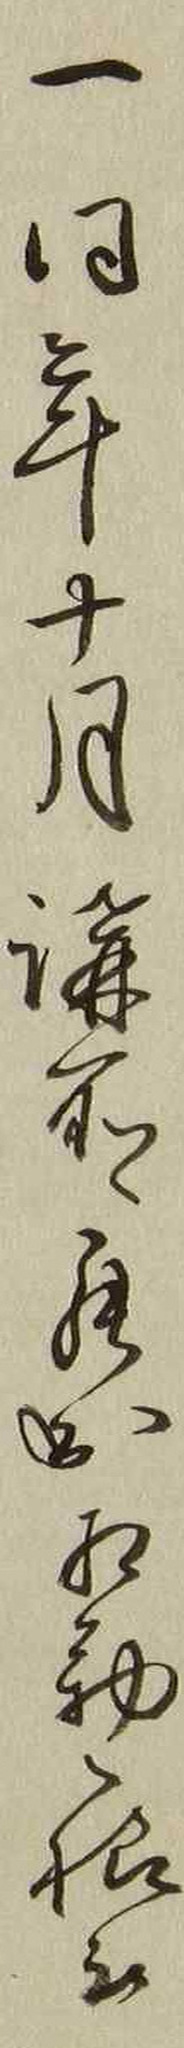一同年十月講所へ罷出相勤候様被
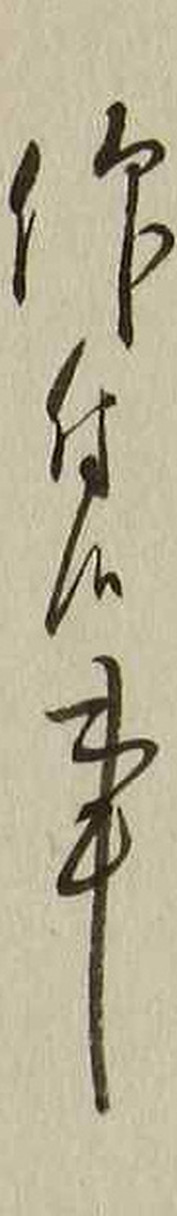仰付候事
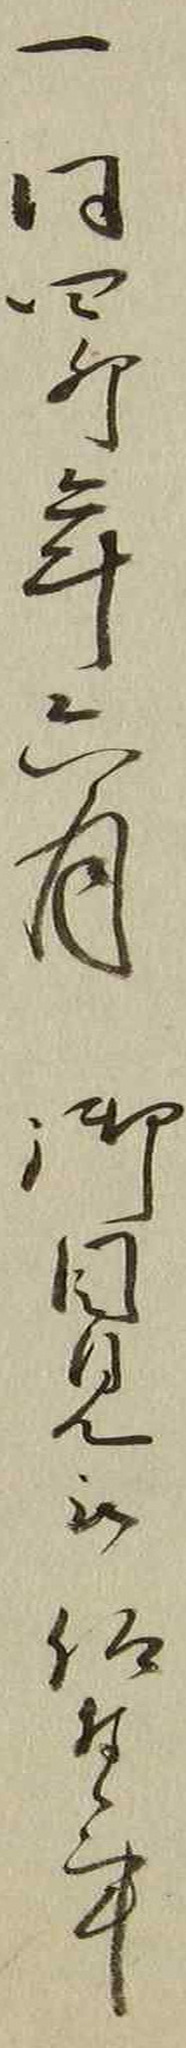一同四卯年六月御目見被仰付候事
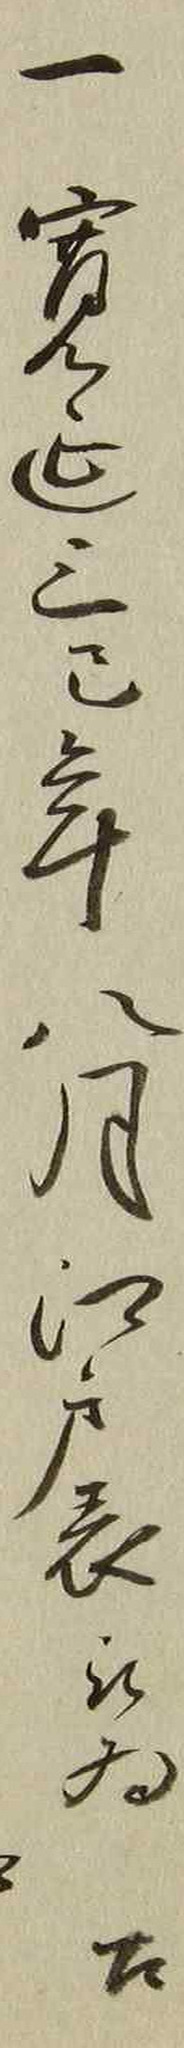一寛延三巳年八月江戸表被為召
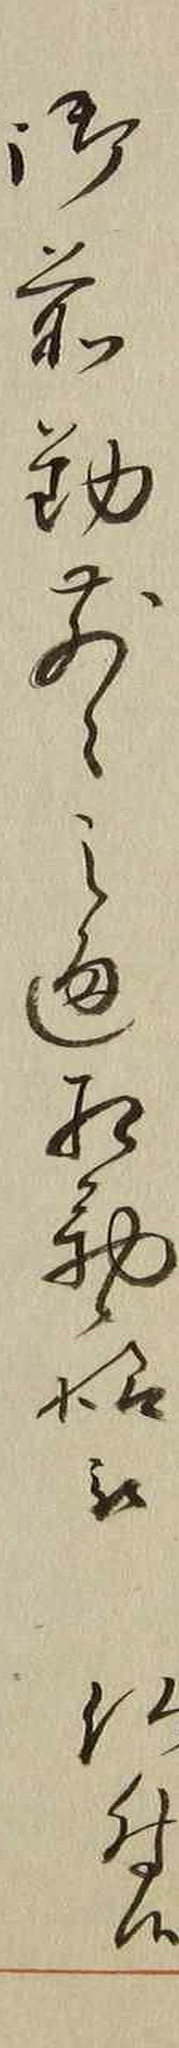御前勤前々之通相勤候様被仰付候
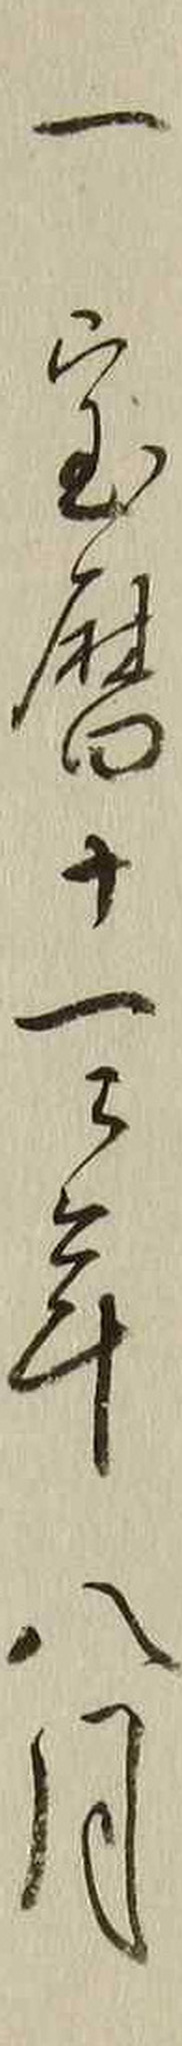一宝暦十一巳年八月
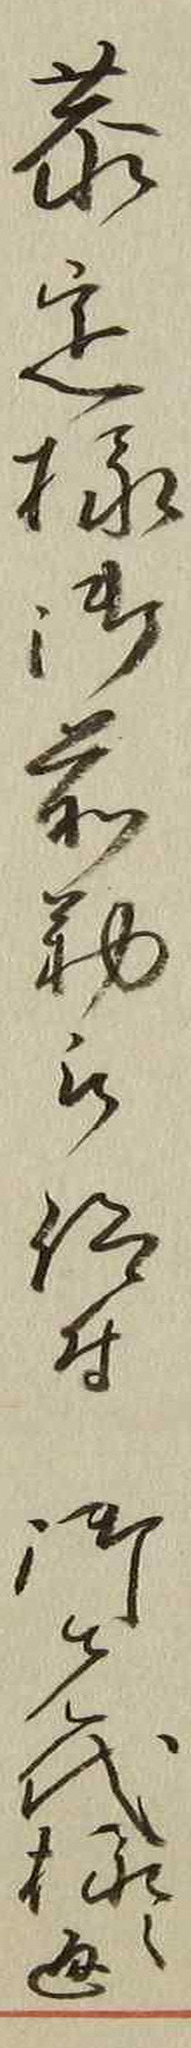恭定様御前勤被仰付御先代様之通
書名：諸士系譜　巻之3　い之部3
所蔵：会津若松市立会津図書館
